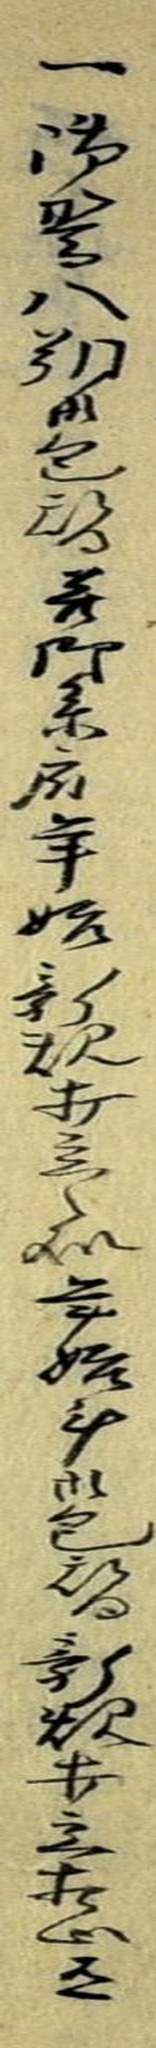一御駕八朔御包替并御参府年始新規打立之処年始斗御包替新規打立相止有
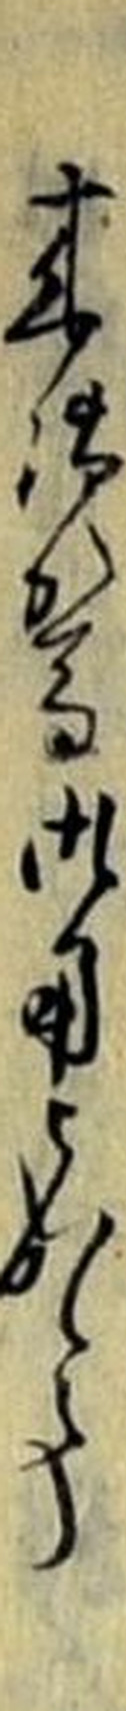来御駕御用被成候事
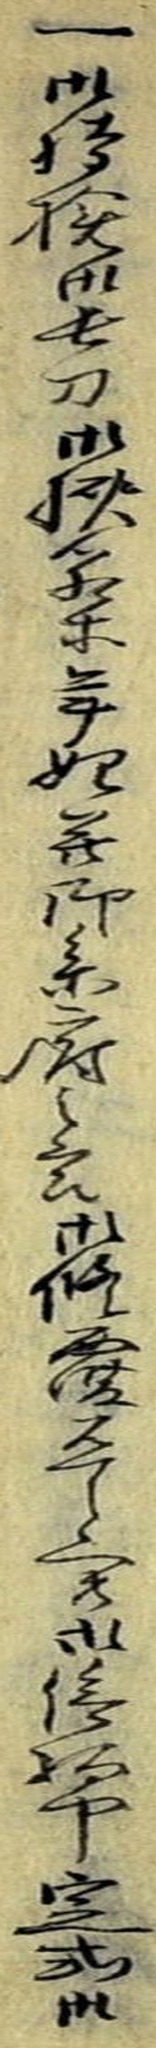一御持槍御長刀御挟箱等年始并御参府之節御修覆有之候へ共御倹約中定式御
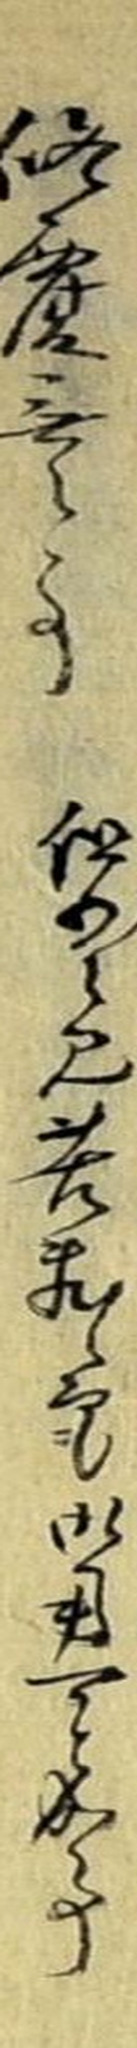修覆無之事但少々見苦敷候而も御用可被成事
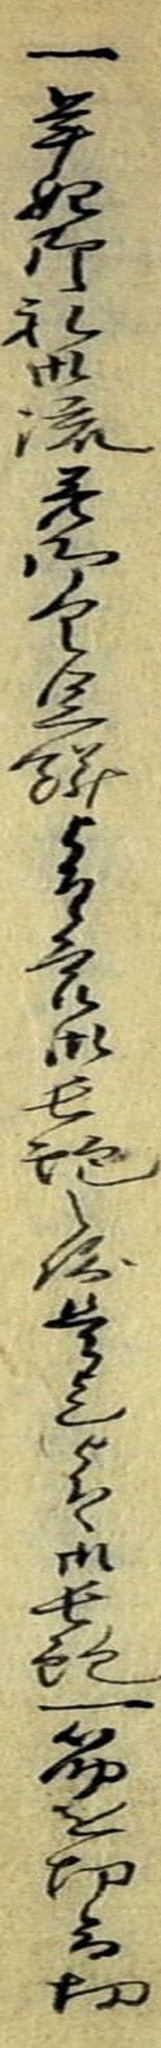一年始御礼御流并御具足餅被下候節御長鮑之儀是迄被下候御長鮑一筋を切候而切
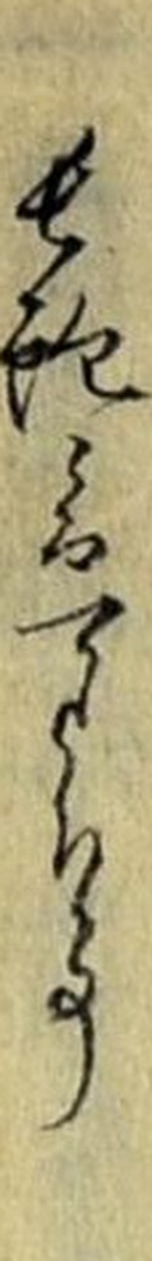長鮑ニ而可被下事
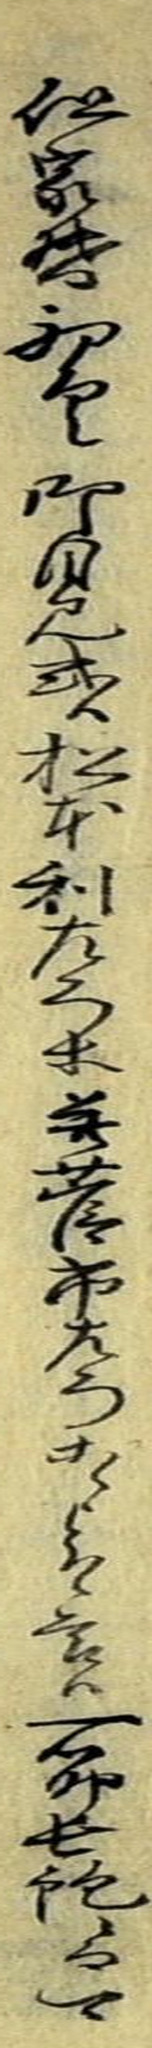但家督初而之御目見或ハ松本利左衛門等并菅市左衛門等へ被下候節ハ一筋長鮑ニ而可
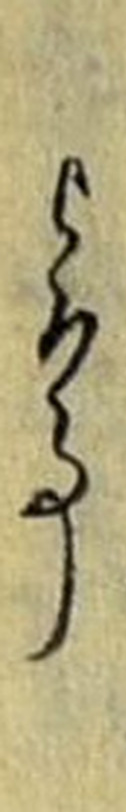被下事
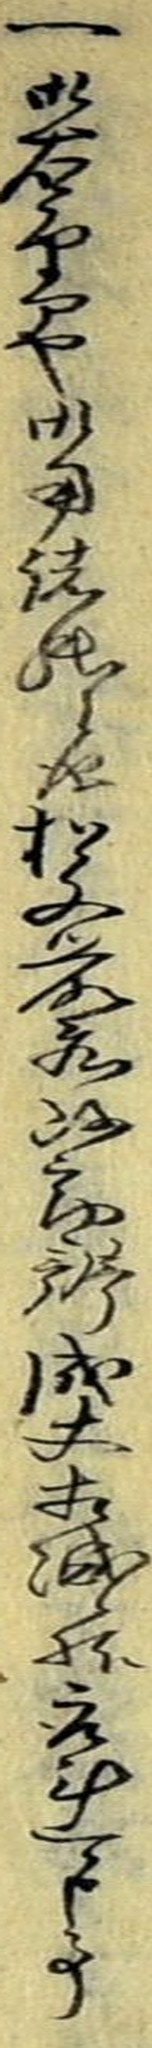一御右筆部屋御用諸紙之儀猶又厳敷致勘弁成丈相減候様取計可申事
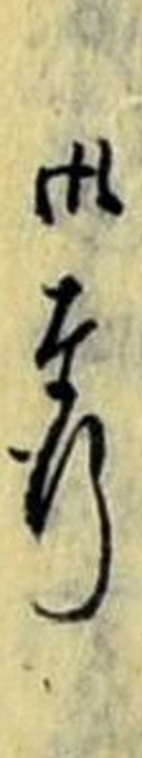御奉行

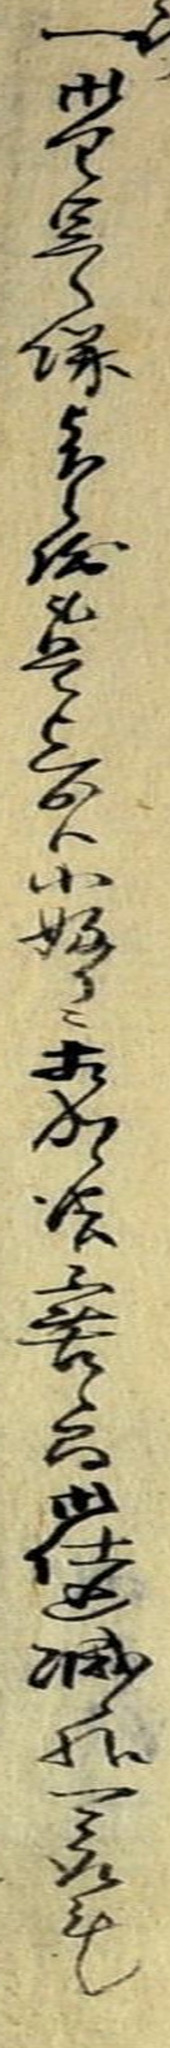一御具足之餅被下候儀も是迄ゟハ小ふりニ相成候儀ハ不苦候間御仕込減候様可取計候
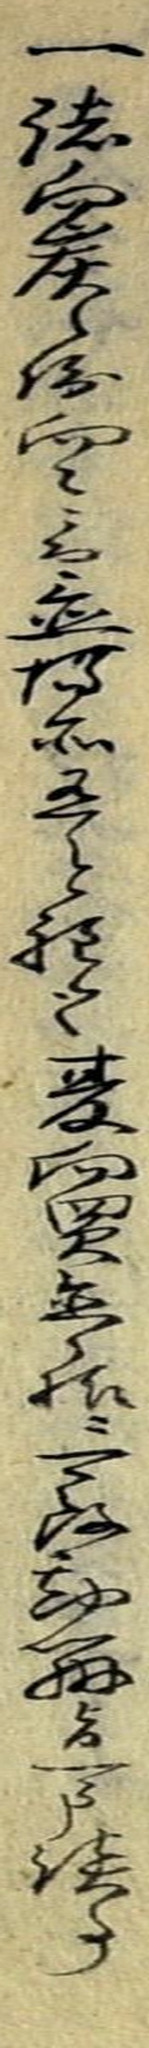一諸向炭之儀向々ニ而置場所有之候程ツヽ夏向甲買置候様ニ可致勘弁旨可申談事
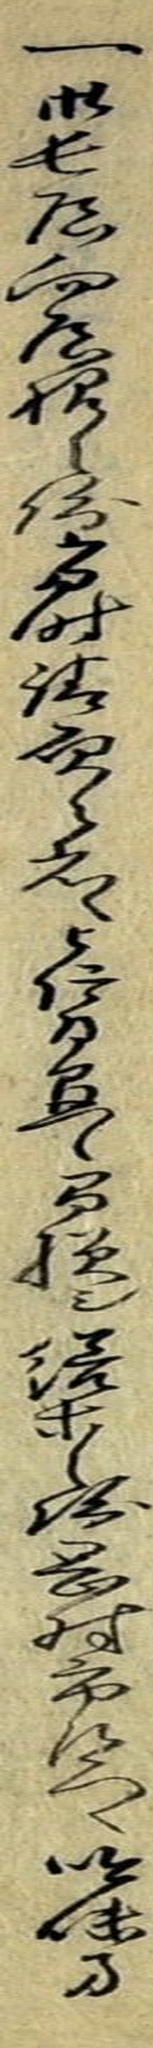一御長屋向屋根之儀当時請負之者へ被仰付置候間損シ繕等之儀御岡村市左衛門へ吟味方
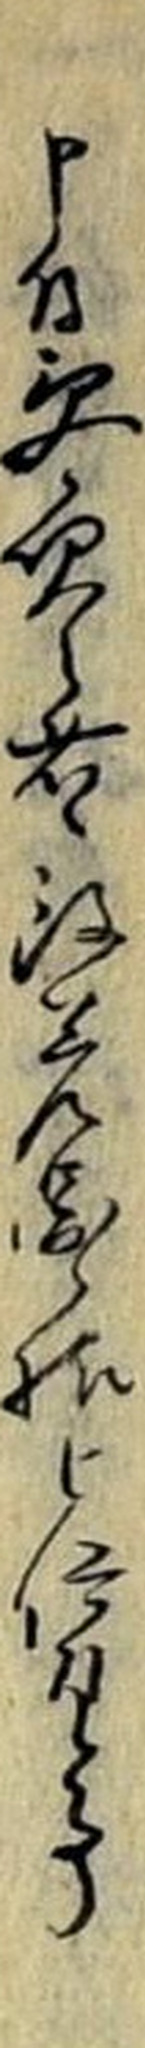申付受負之者へ致差図候様被仰付候事
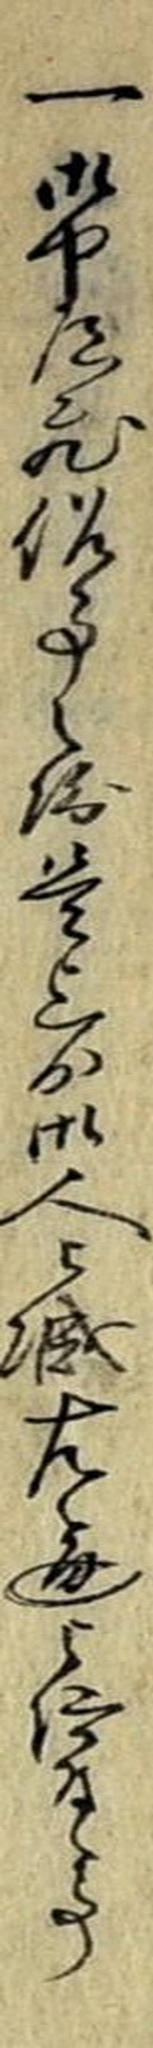一御中屋敷作事之儀是迄ゟ御人被減左之通被仰付候事
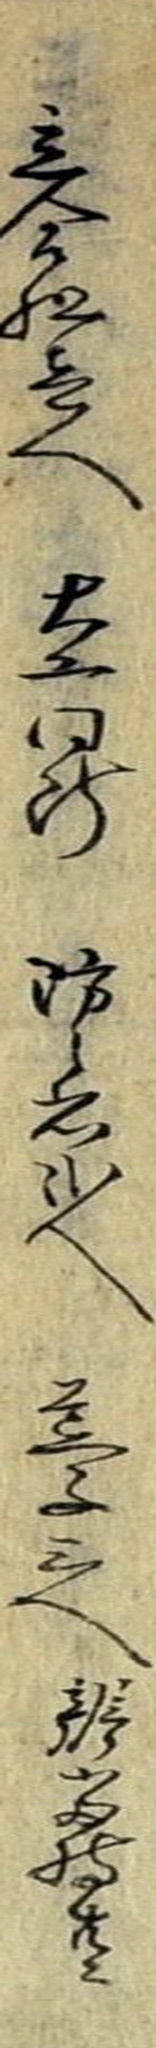立合組壱人大工同断防之者弐人荒子三人弁当持共ニ
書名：命令之部 三
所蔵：福井県文書館 Fukui Prefectural Archives
